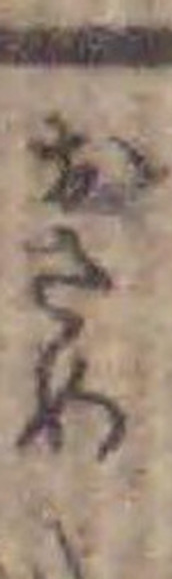おさめ

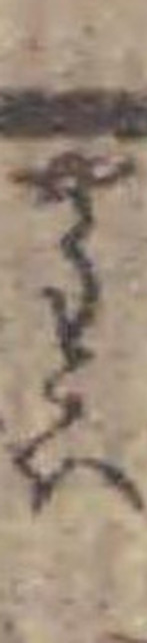やうとは
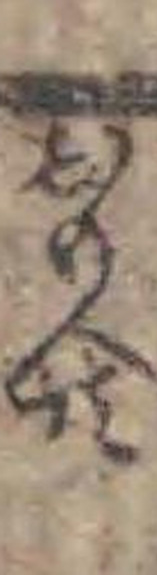おもへ共
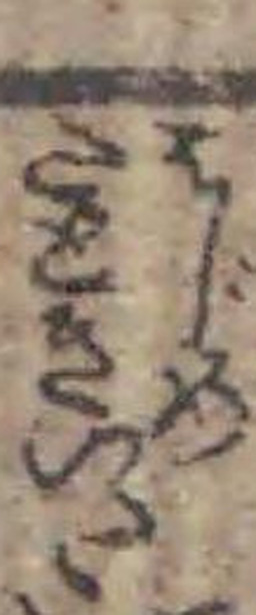たときいた
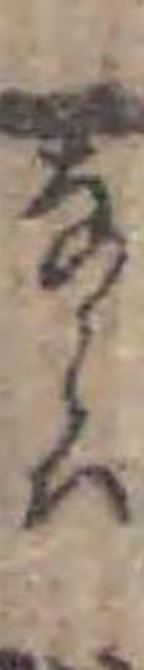ならば
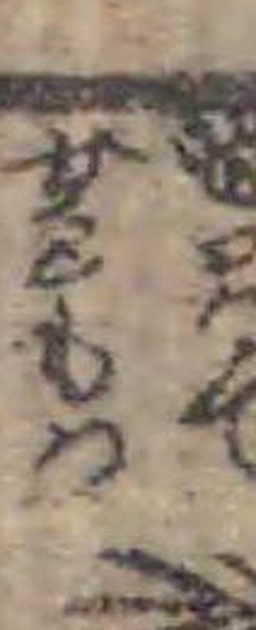女ともが
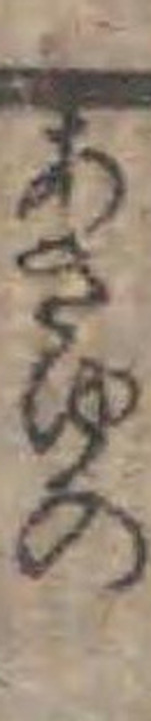あさゆの
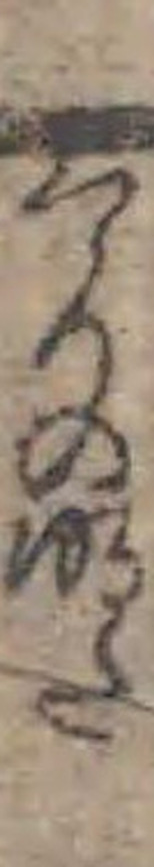くゝりの明た
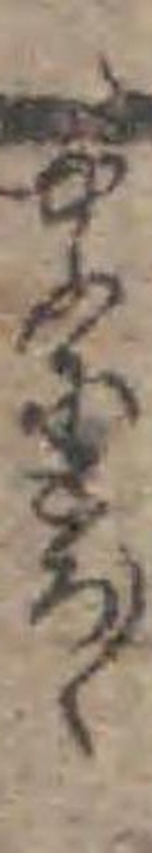やふにとろ〳〵
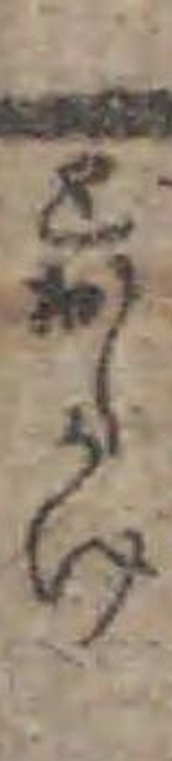とおしかけ
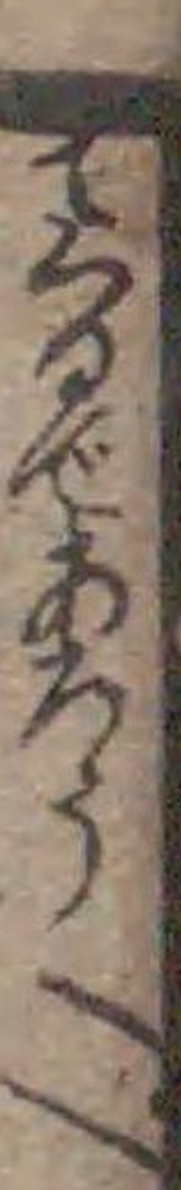てくるであろう
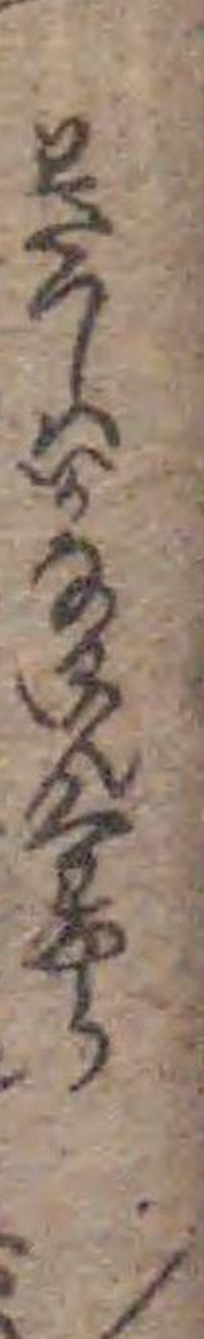わたくしはいかなるいんぐわやら
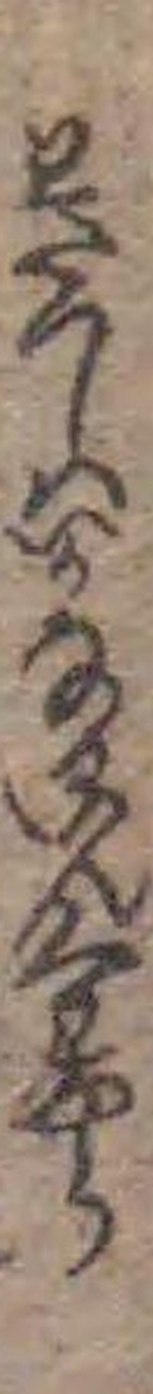わたくしはいかなるいんぐわやら
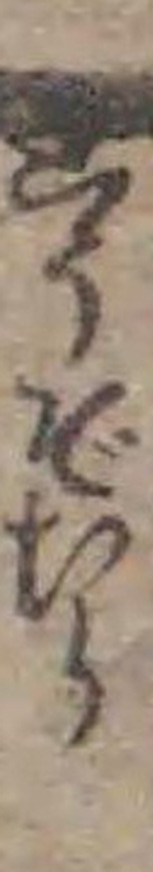とうぞちう
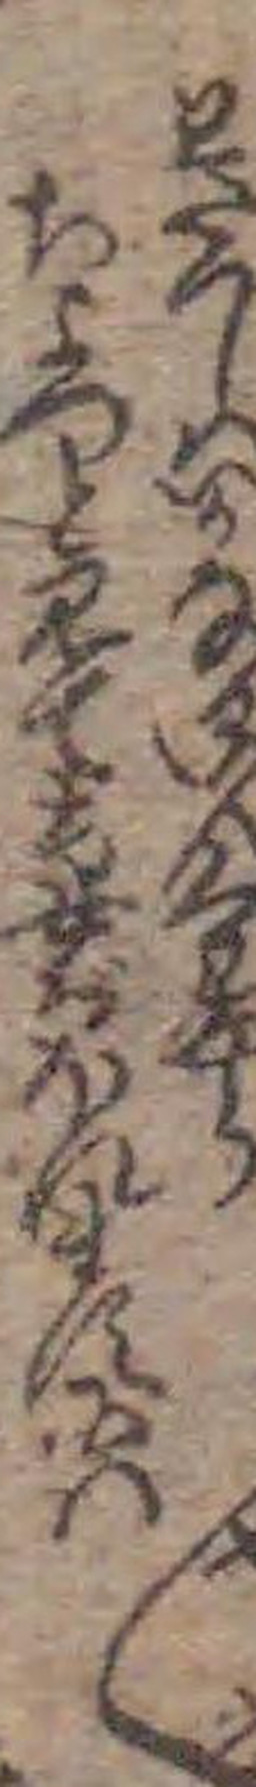ちょっと見ても女がほれますには
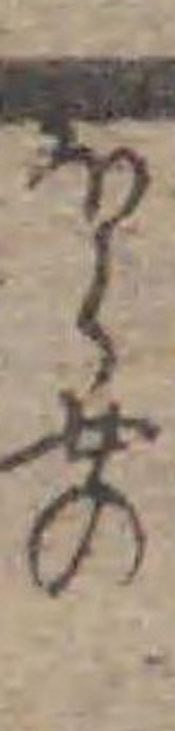ほど女の
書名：通風伊勢物語 : 3巻
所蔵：国立国会図書館 National Diet Library, JAPAN
